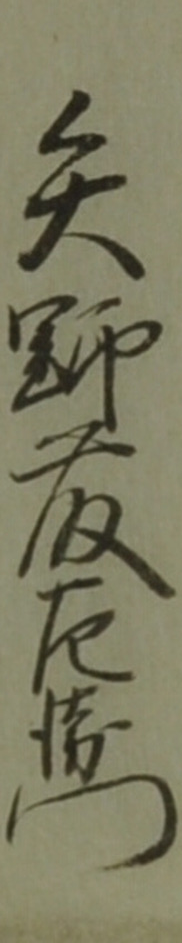矢野藤左衛門
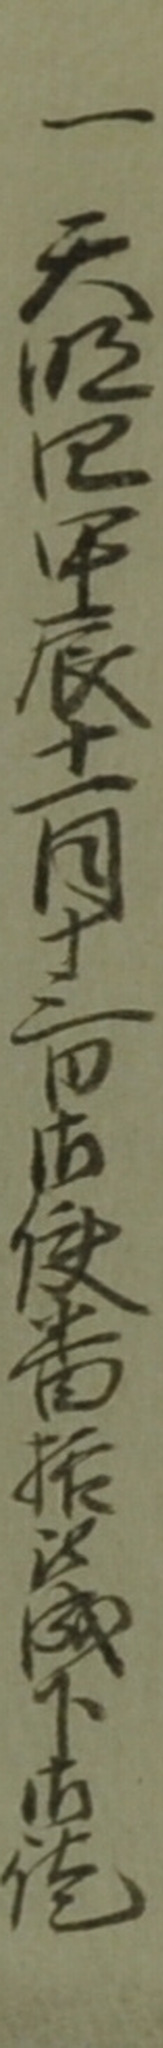一天明四甲辰十一月十三日御使番格被成下御徒
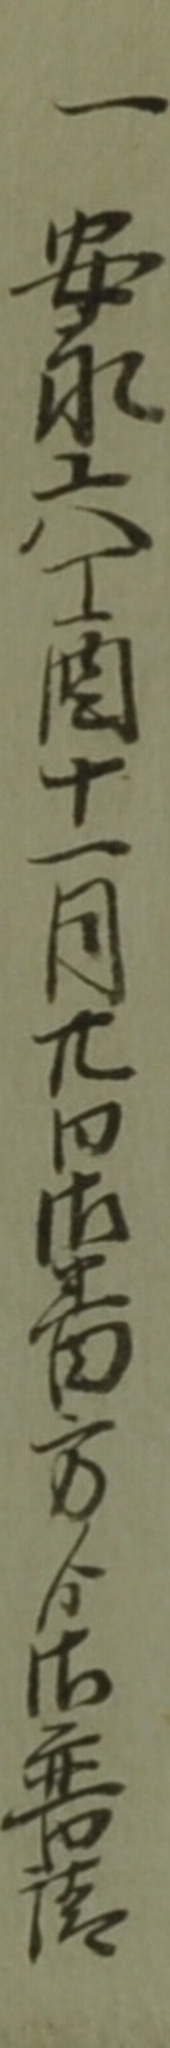一安永六丁酉十一月廿日御番方ゟ御普請
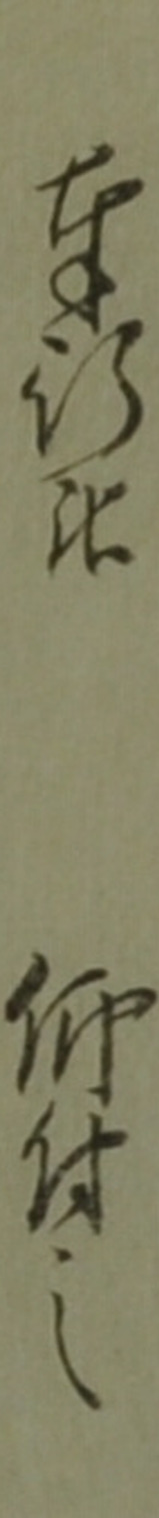奉行被仰付之
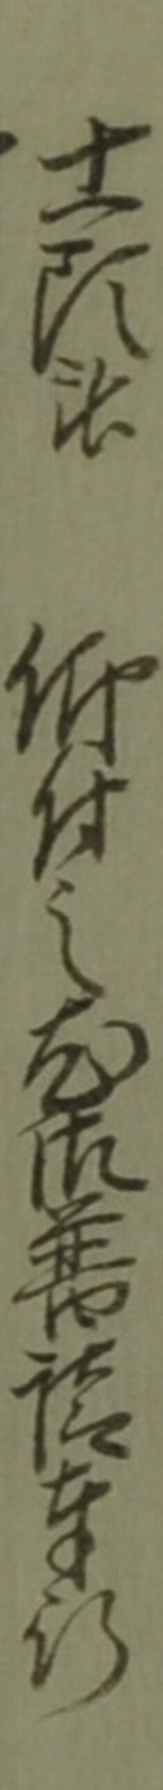士頭被仰付之尤御普請奉行
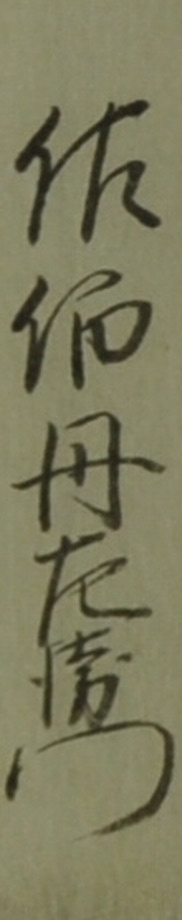佐伯丹左衛門
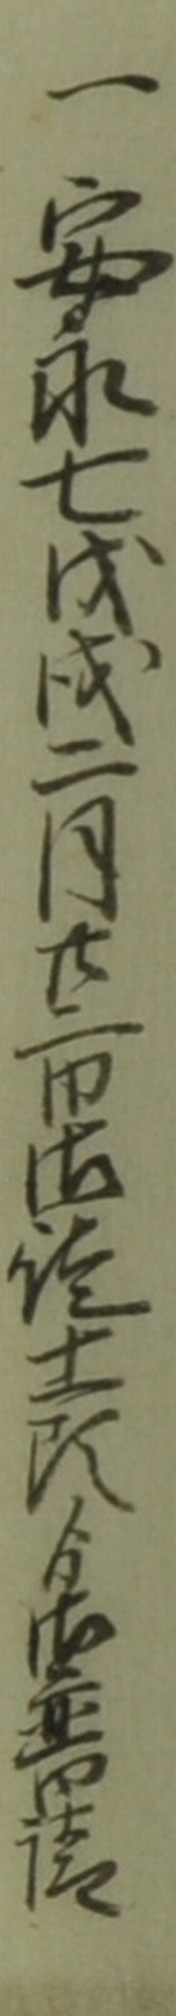一安永七戊戌二月廿二日御徒士頭ゟ御普請

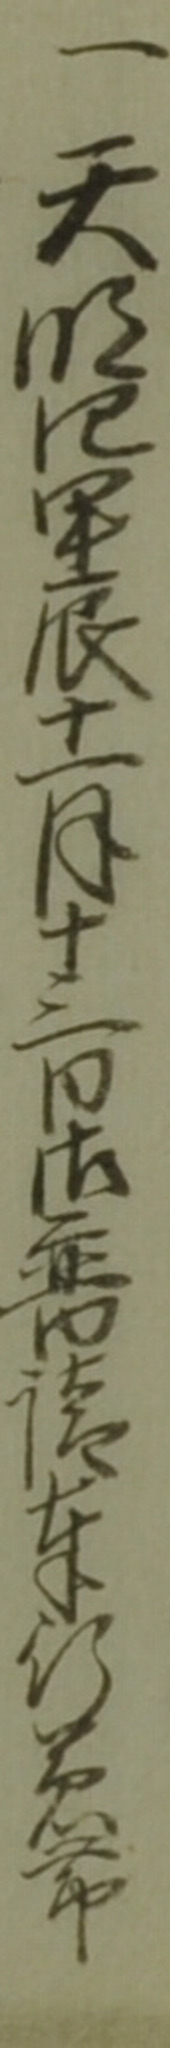一天明四甲辰十一月十三日御普請奉行兼帯
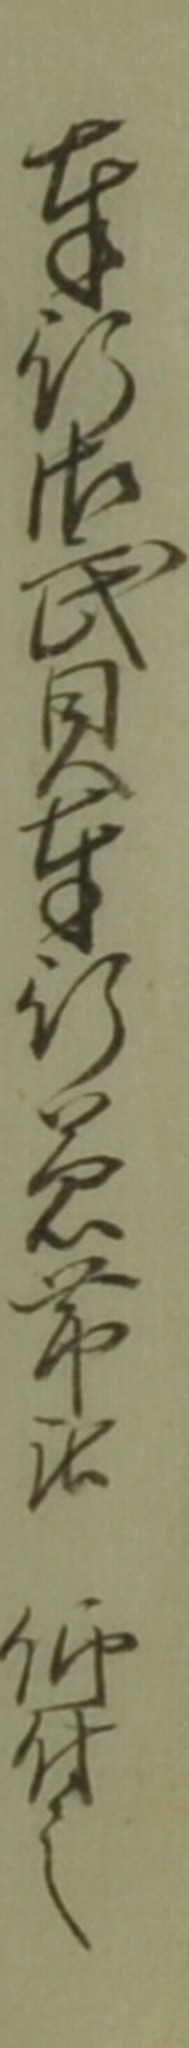奉行御武具奉行兼帯被仰付之
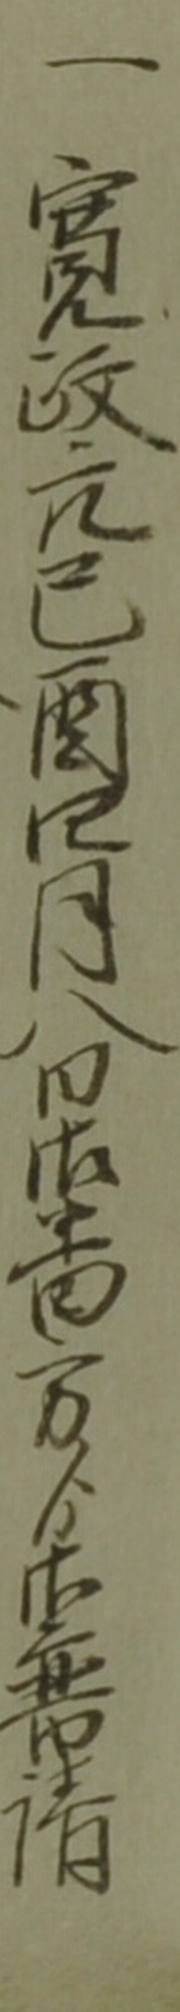一寛政元己酉四月八日御番方ゟ御普請
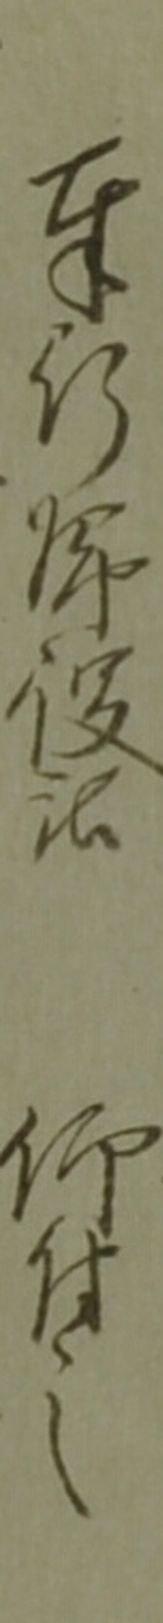奉行帰役被仰付之
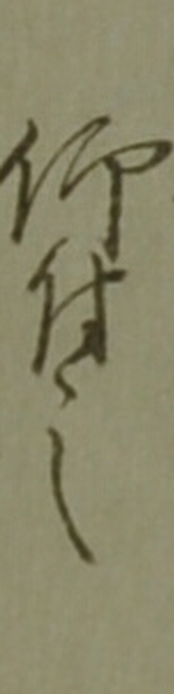仰付之
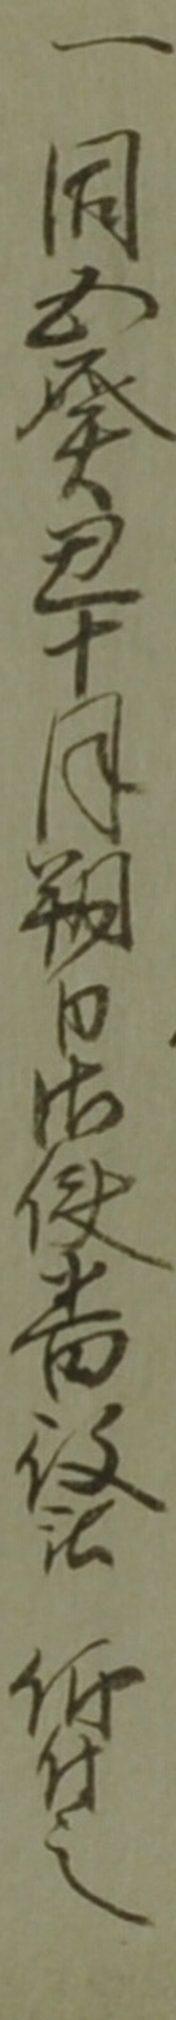一同五癸丑十月朔日御使番役被仰付之
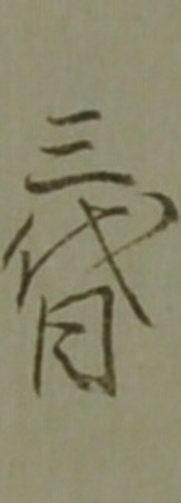三代目
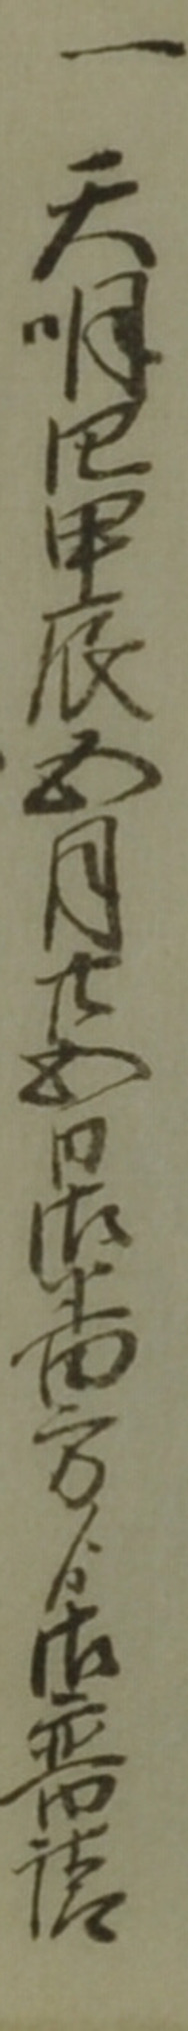一天明四甲辰五月廿五日御番方ゟ御普請
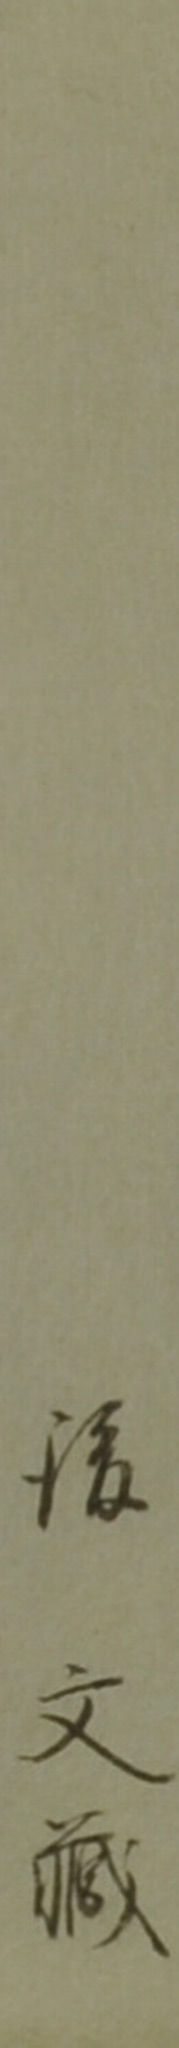後文蔵
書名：諸御役代々録（六）
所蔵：伊那市立高遠町図書館・合同会社AMANE
